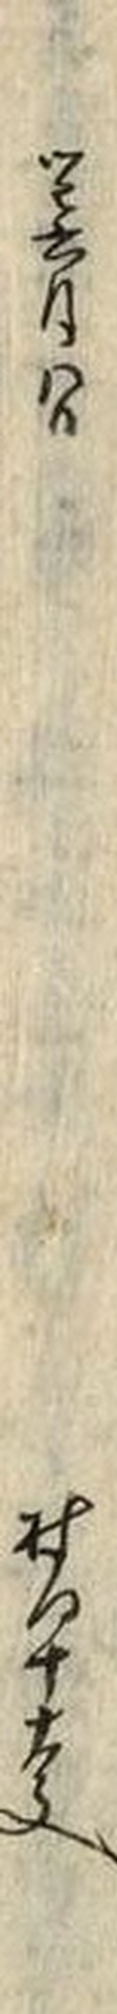閏六月八日村田十大夫
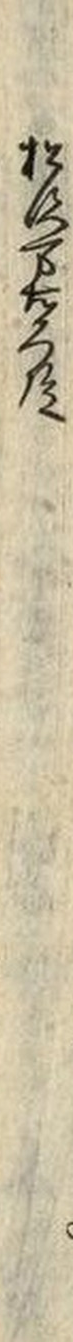松沢万右衛門殿
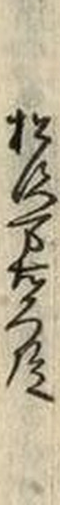松沢万右衛門殿
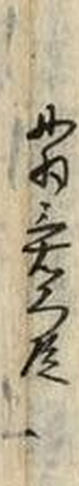丹羽三右衛門殿
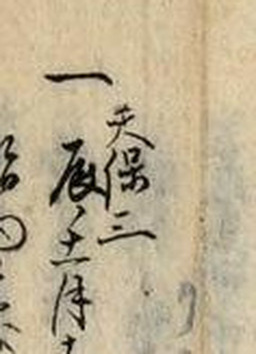天保三
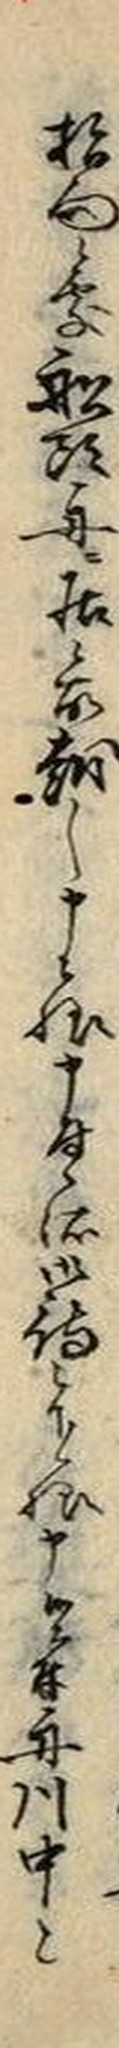指向候処船頭舟に居候故越し申候様申付候所御待被下候様申候に付舟川中と

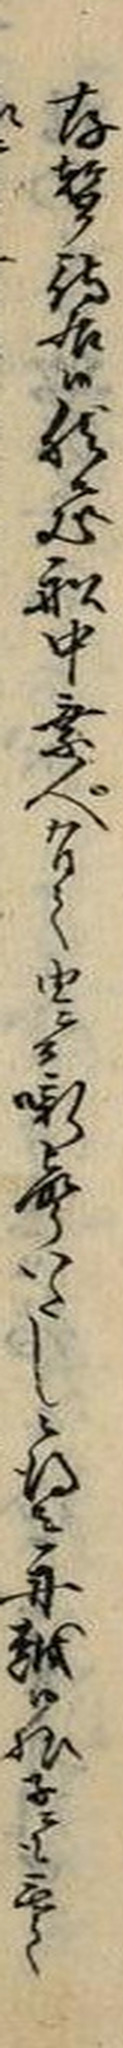存暫ク待居候然ル処船中乗人有之由にて噺声いたし候得は舟越候様子にも無之
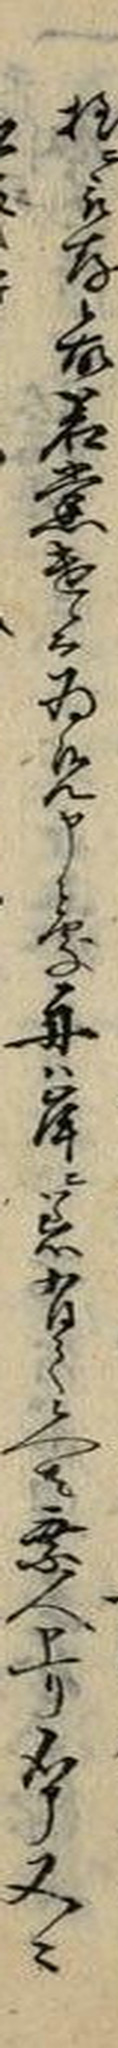様に被存候故若党遣候て為見申候処舟は岸に着有之候へは乗人上り不申又々
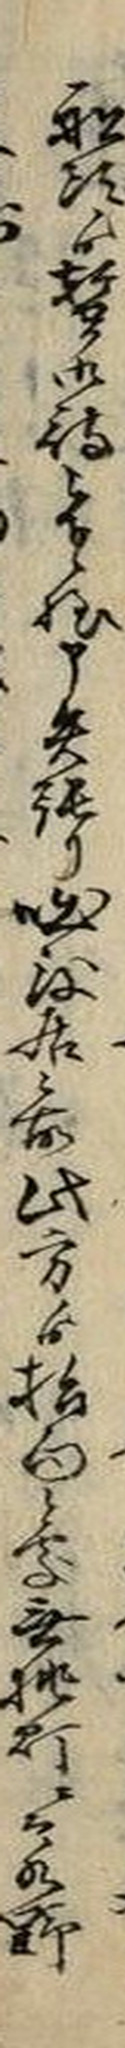船頭ゟ暫ク御待被下候様申矢張り咄致居候故此方ゟ指向候処無挑灯にて水野
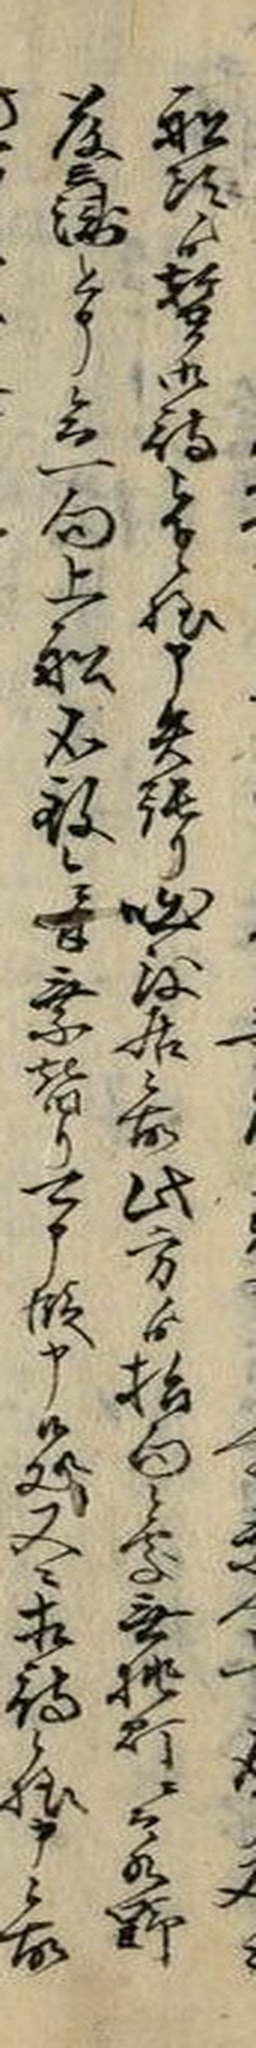藤兵衛と申候て一向上船不致候に付乗替り可申段申候処又々相待候様申候故
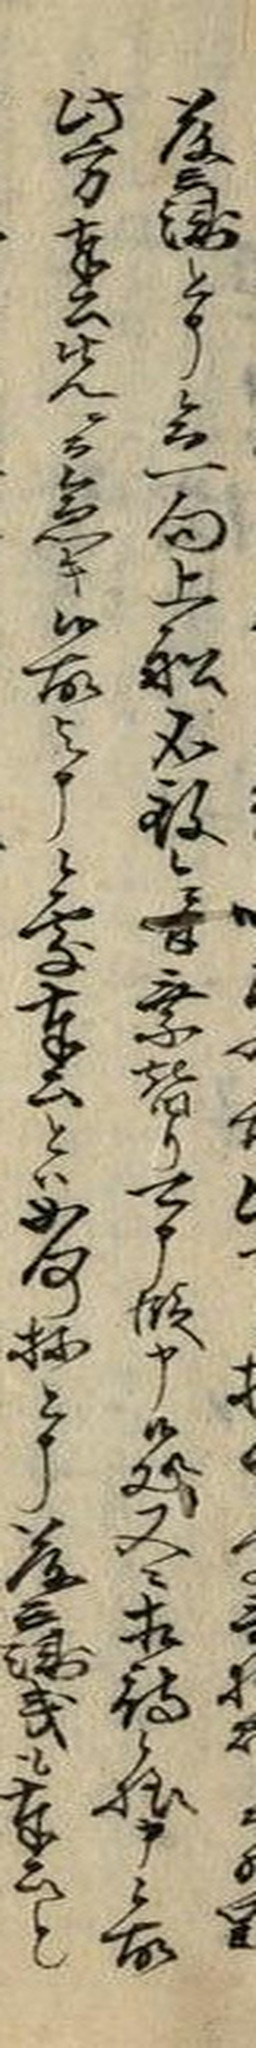此方奉公先にて急キ候故と申候処奉公とは如何抔と申藤兵衛義も奉公と
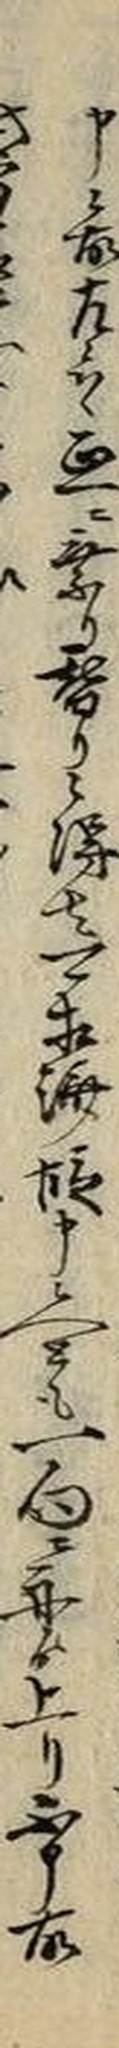申候故左候はゝ互に乗り替り候得は可相済段申候へとも一向に舟ゟ上り不申故
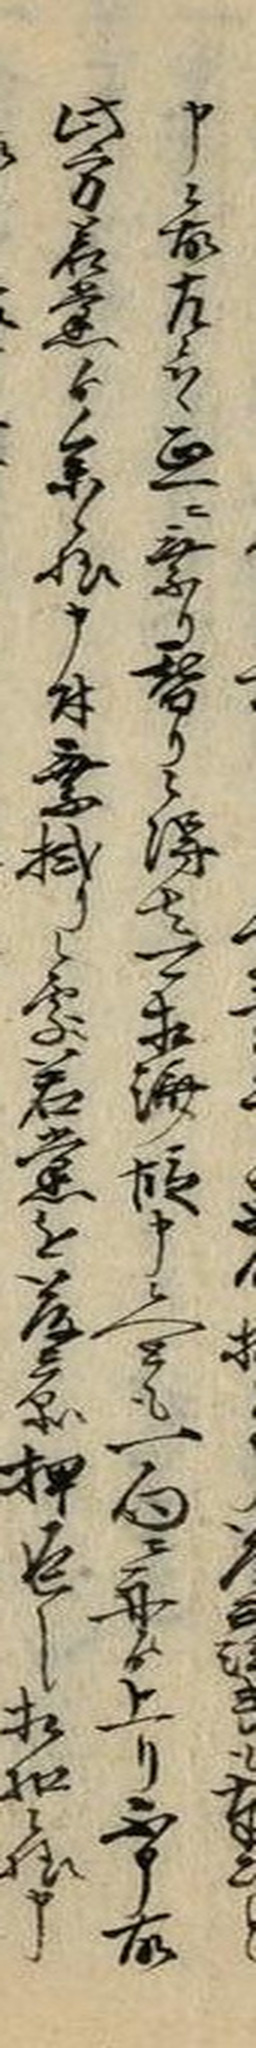此方若党ゟ参候様申付乗掛り候処若党を藤兵衛押返し相控候様申
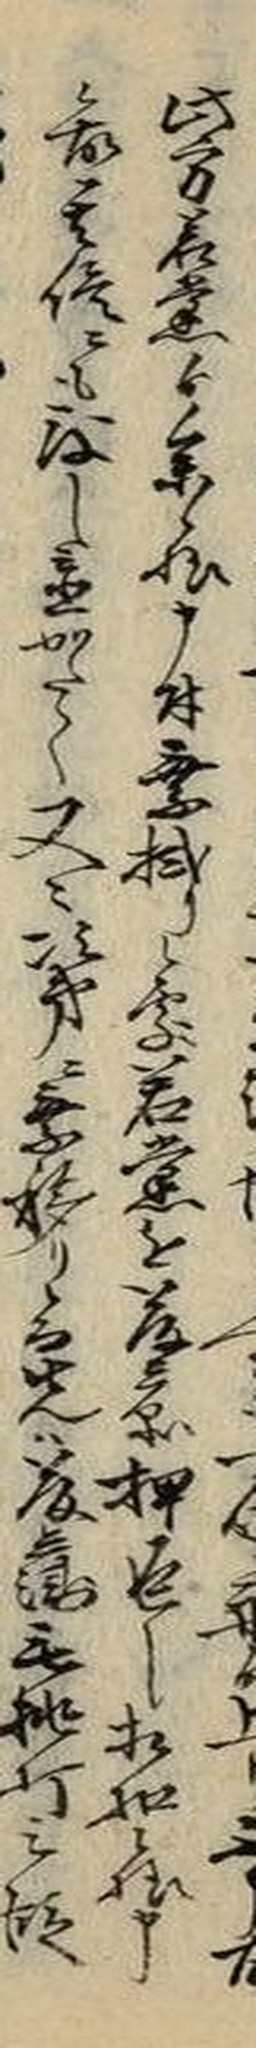候故其儘にも致し置かたく又々次第に乗移り候て先は藤兵衛無挑灯之段
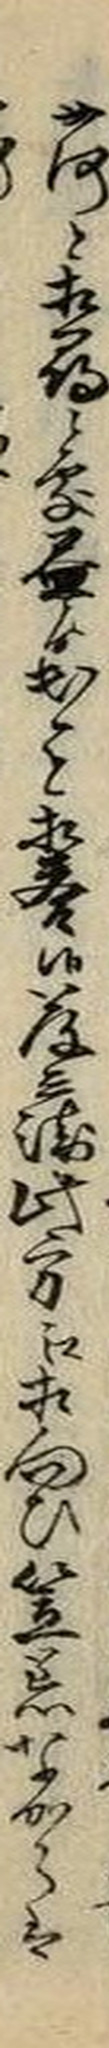如何と相尋候処昼ゟ出候と相答候藤兵衛此方え相向ひ笠着なからは
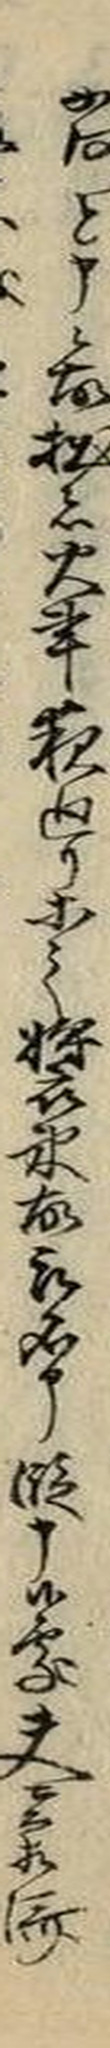如何と申候故拙者火事夜廻り等之装束故取不申段申候処夫にて相済
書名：御城下諸事之部
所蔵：福井県文書館 Fukui Prefectural Archives
